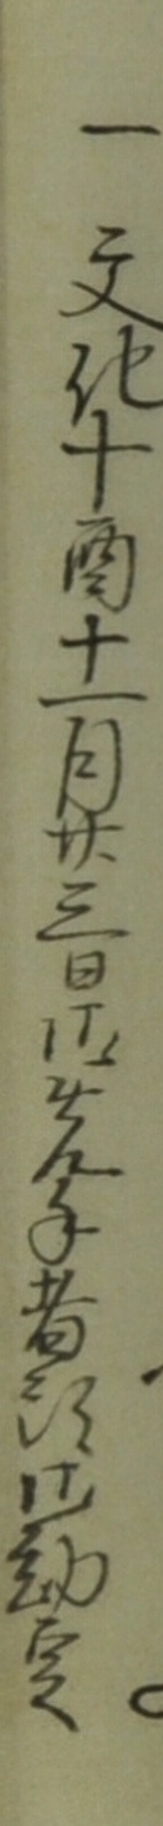一文化十酉十一月廿三日御先手者頭御勘定
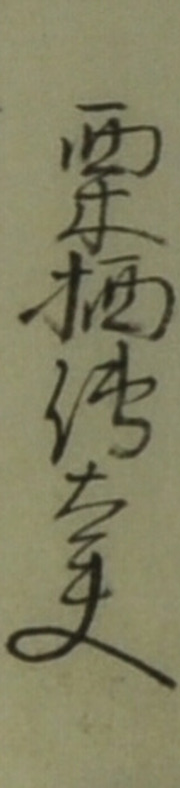栗栖伝太夫

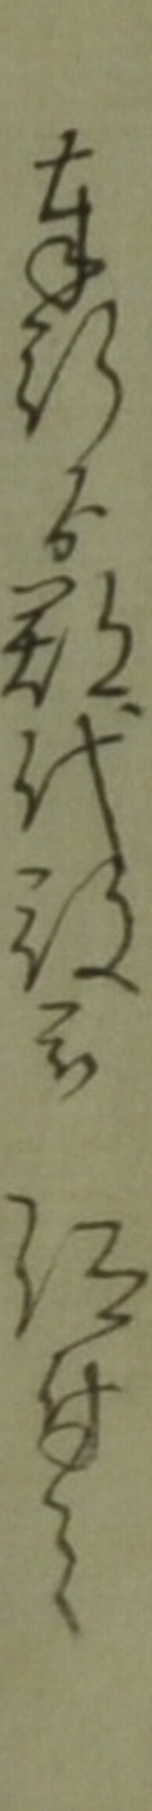奉行ゟ郡代役被仰付之
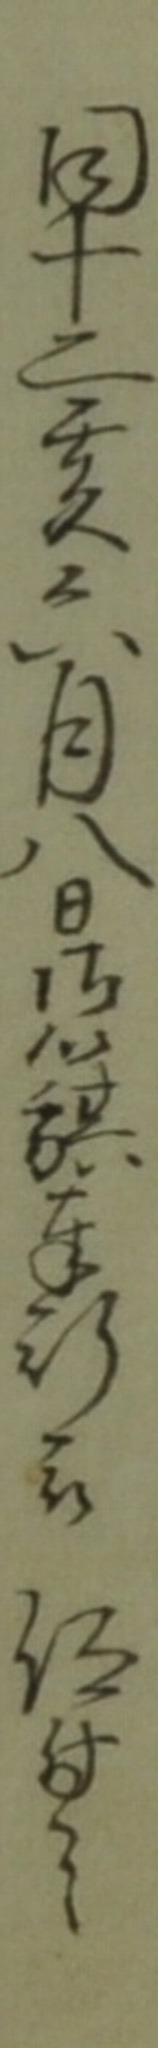一同十二亥六月八日御籏奉行被仰付之
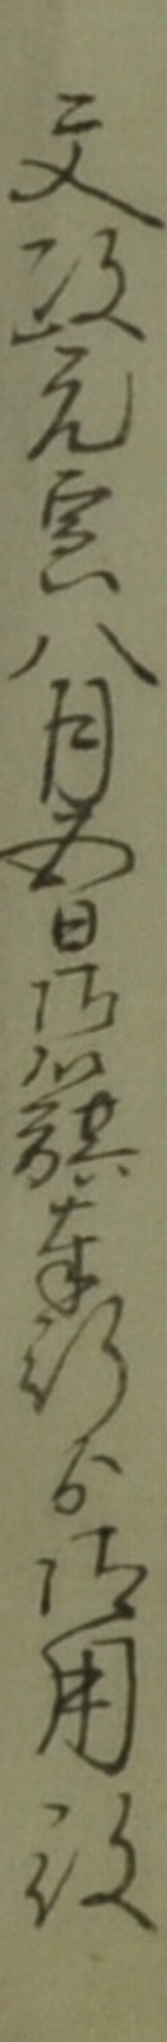一文政元寅八月五日御籏奉行ゟ御用役
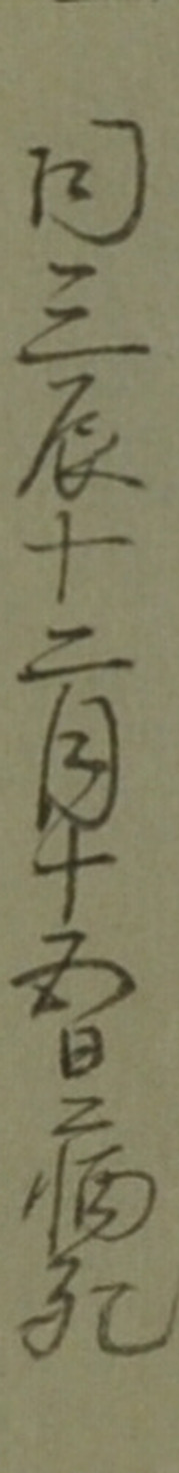一同三辰十二月十五日病死
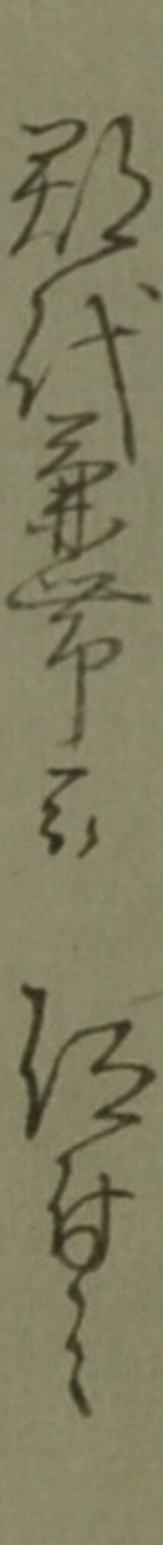郡代兼帯被仰付之
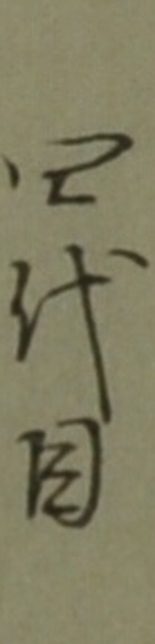四代目
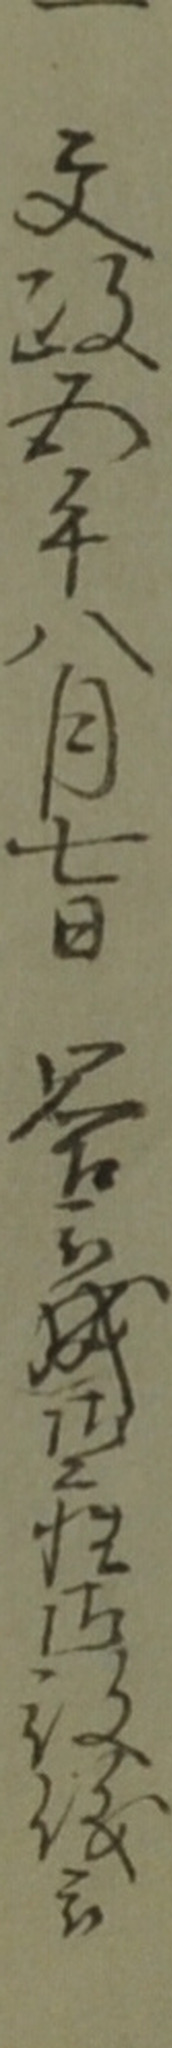一文政五午八月七日思召被成御座役儀被
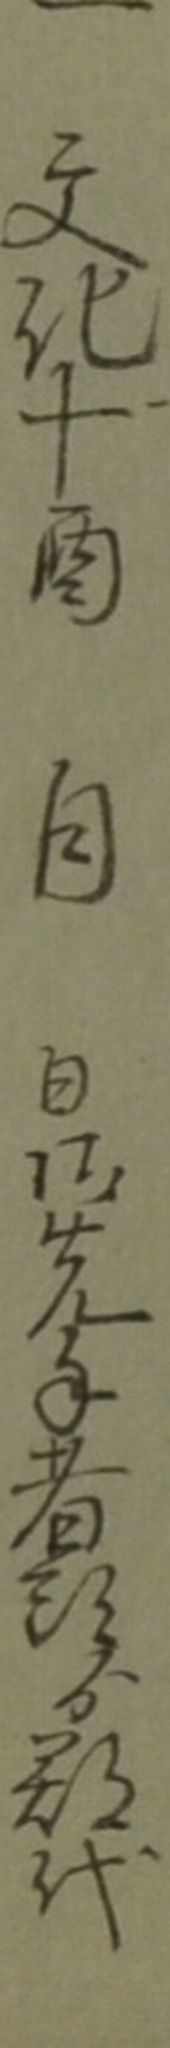一文化十酉月日御先手者頭ゟ郡代
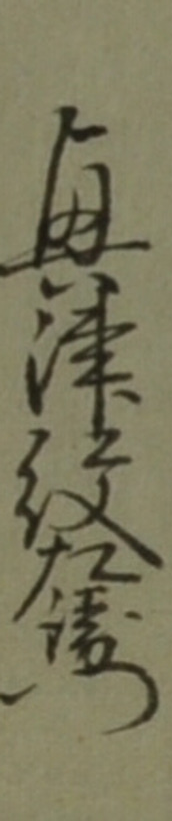奥津紋左衛門
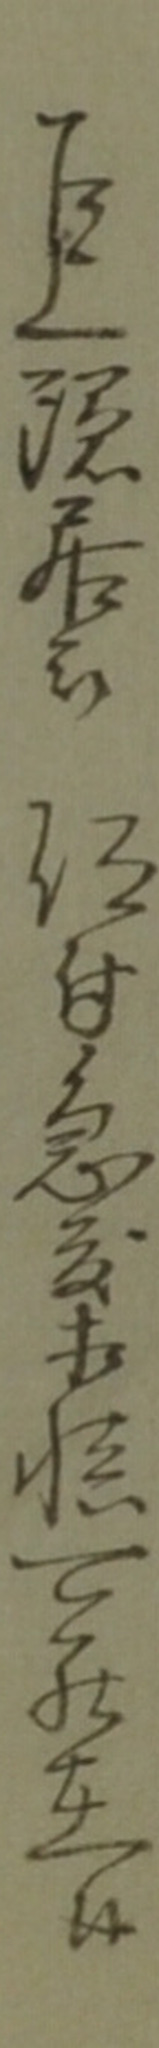召上隠居被仰付急度相慎可罷在候
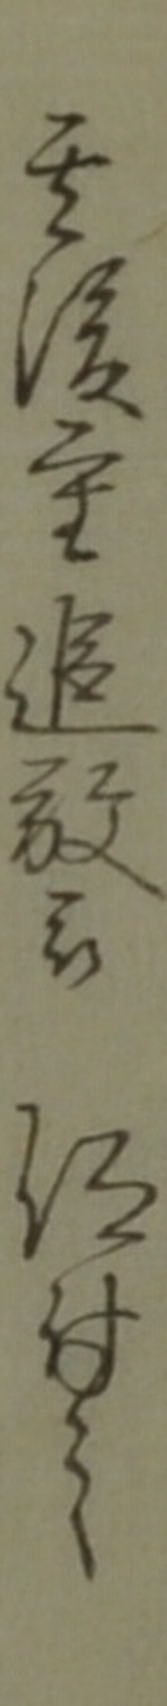其後重追放被仰付之
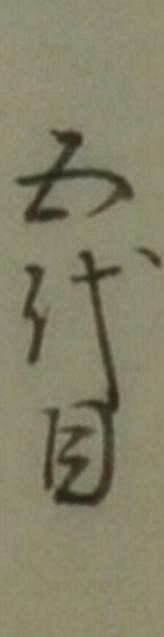五代目
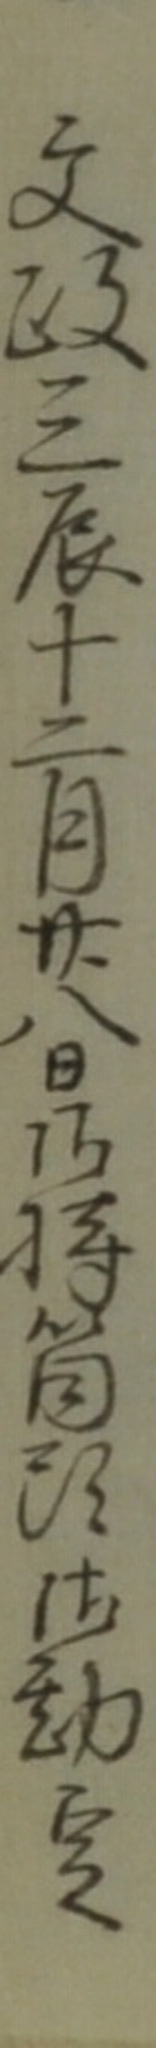一文政三辰十二月廿八日御持筒頭御勘定
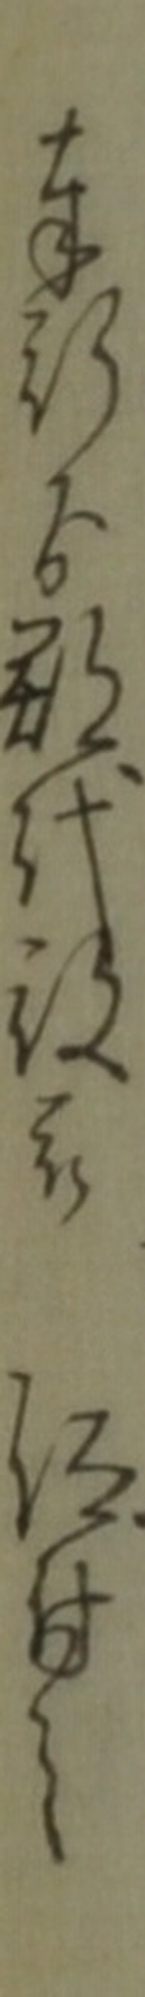奉行ゟ郡代役被仰付之
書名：諸御役代々録（二）
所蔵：伊那市立高遠町図書館・合同会社AMANE
